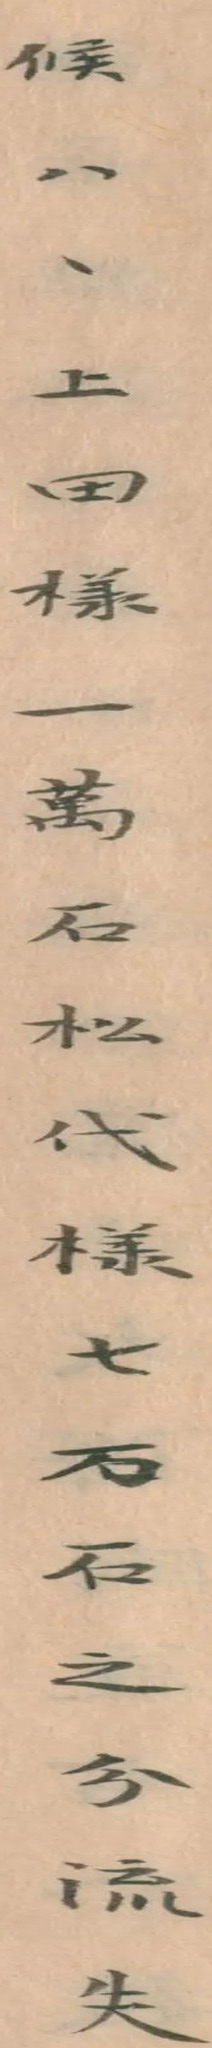候ハゝ上田様一万石松代様七万石之分流失
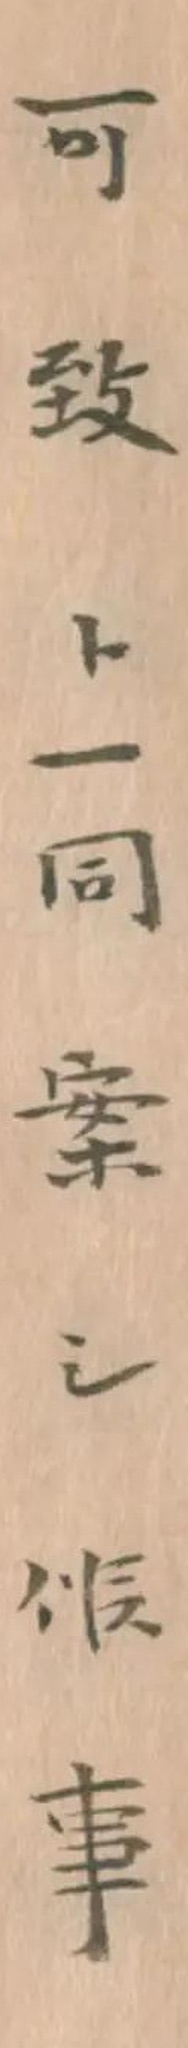可致ト一同案シ候事
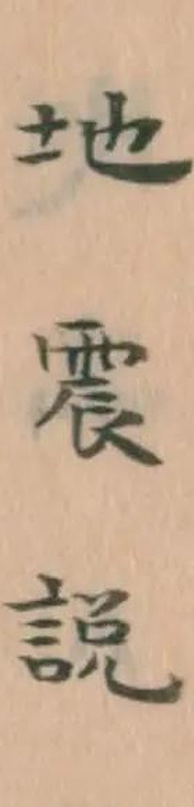地震説
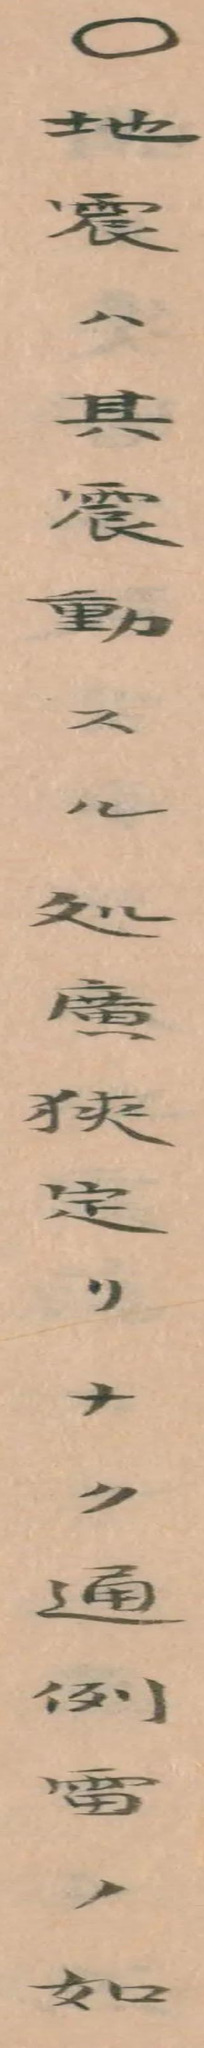〇地震ハ其震動スル処広狭定りナク通例雷ノ如
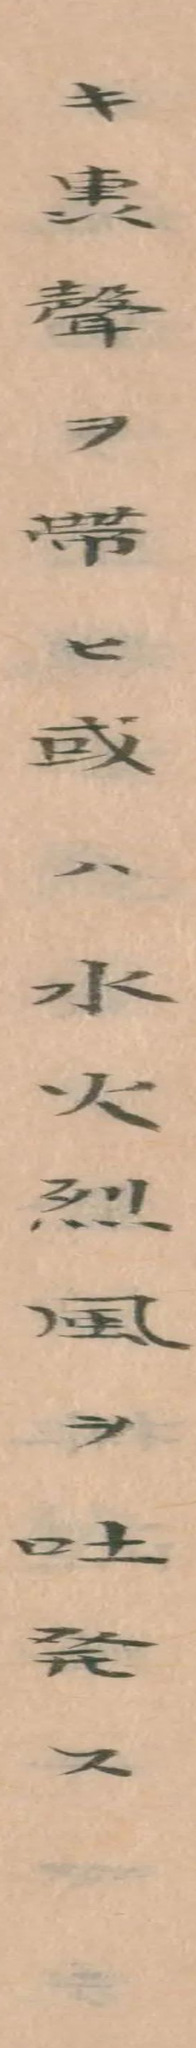キ轟声ヲ帯ヒ或ハ水火烈風ヲ吐発ス
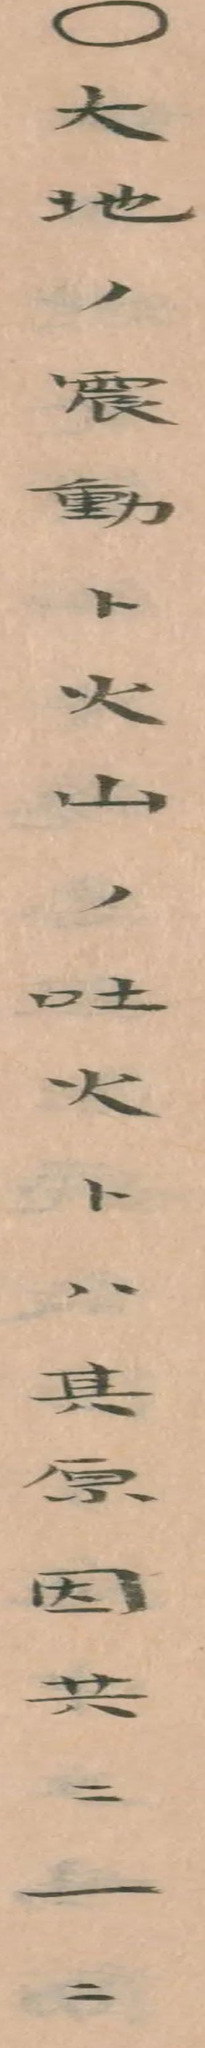〇大地ノ震動ト火山ノ吐火トハ其原因共二一二
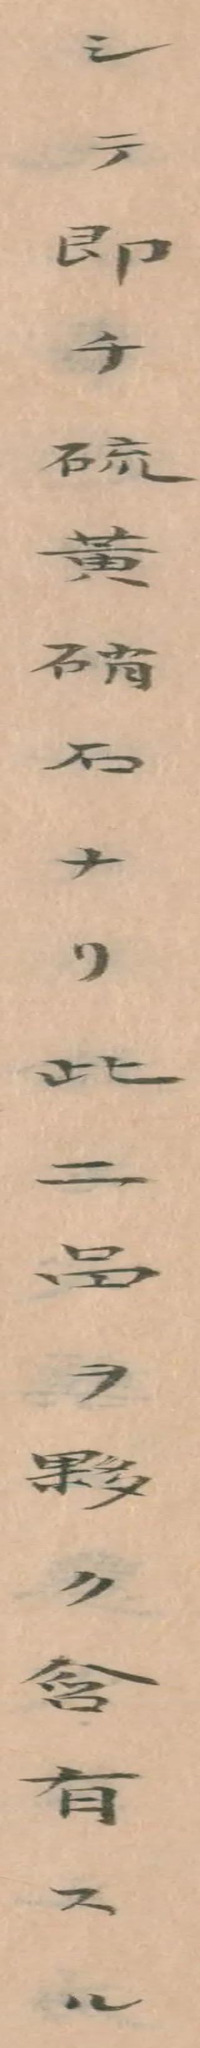シテ即チ硫黄硝石ナリ此二品ヲ夥ク含有スル
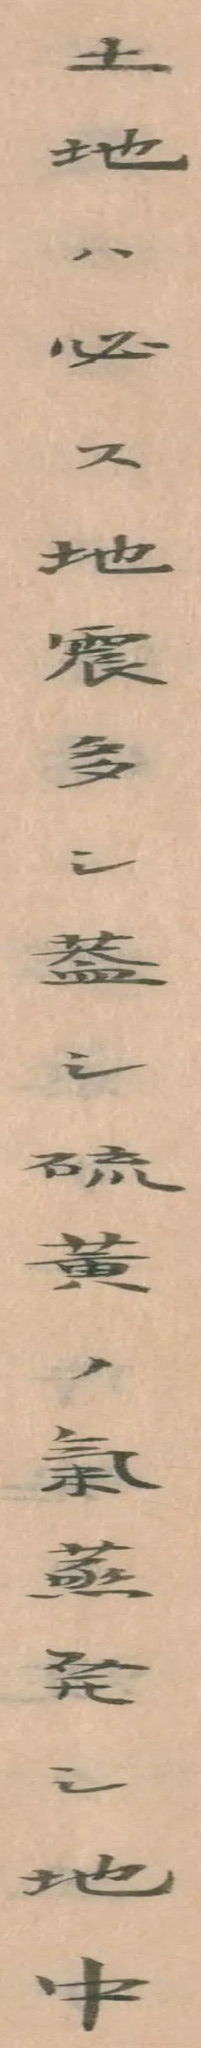土地ハ必ス地震多シ蓋シ硫黄ノ気蒸発シ地中
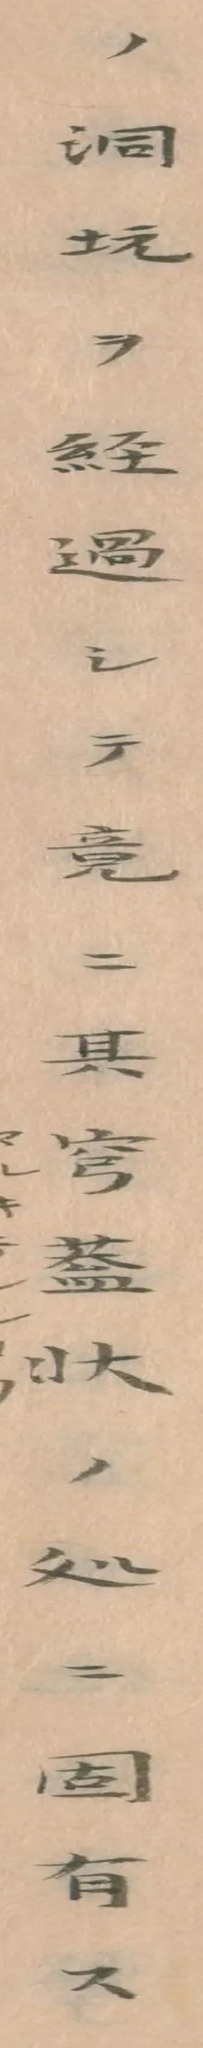ノ洞坑ヲ経過シテ竟二其穹蓋状ノ処二固有ス
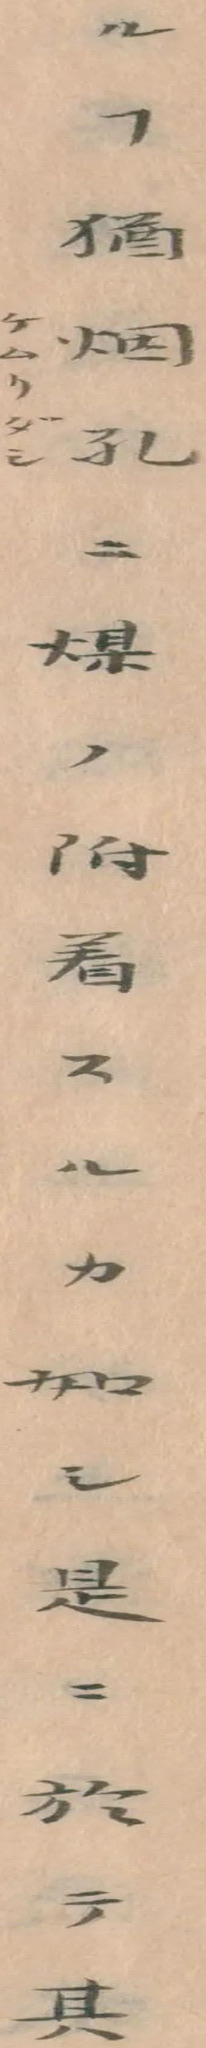ル事猶烟孔二煤ノ付着スルカ如シ是二於テ其
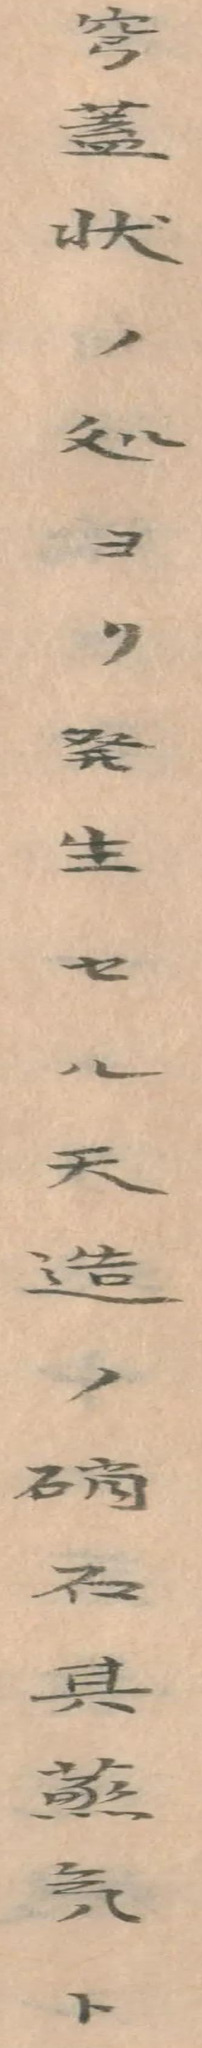穹蓋状ノ処ヨリ発生セル天造ノ硝石其蒸気ト
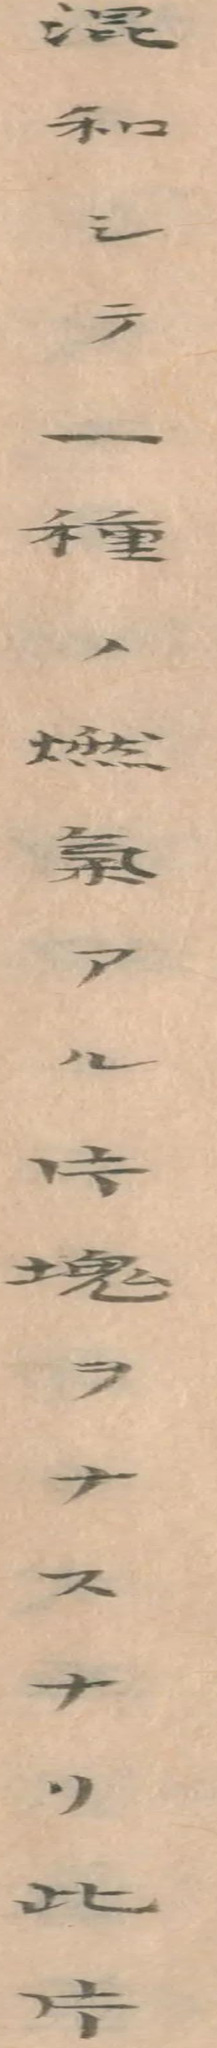混和シテ一種ノ燃気アル片塊ヲナスナリ此片

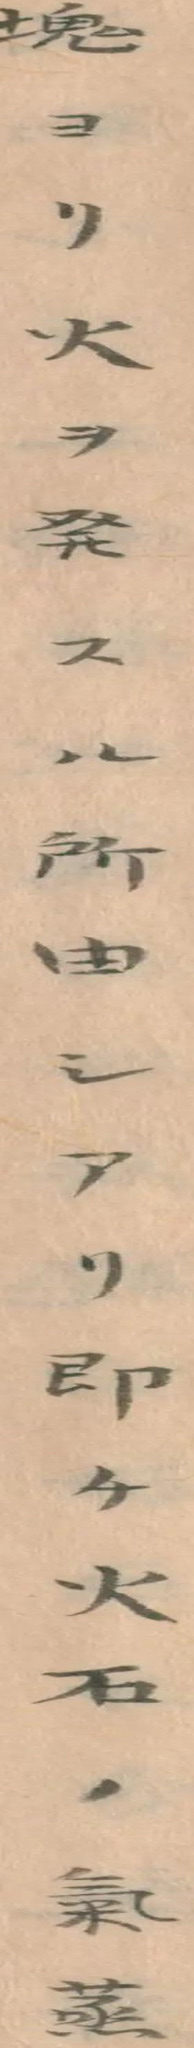塊より火ヲ発スㇽ所由シアリ即チ火石ノ気蒸
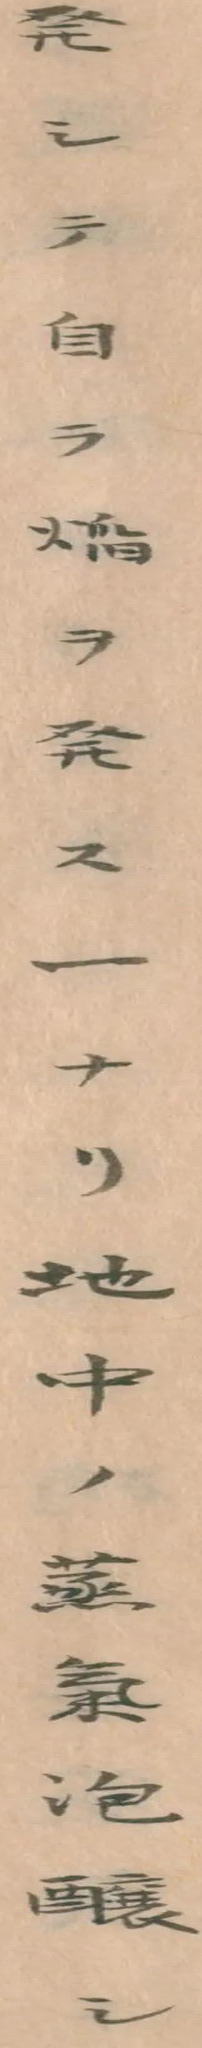発シテ自ラ焔ヲ発ス一ナリ地中ノ蒸気泡醸シ
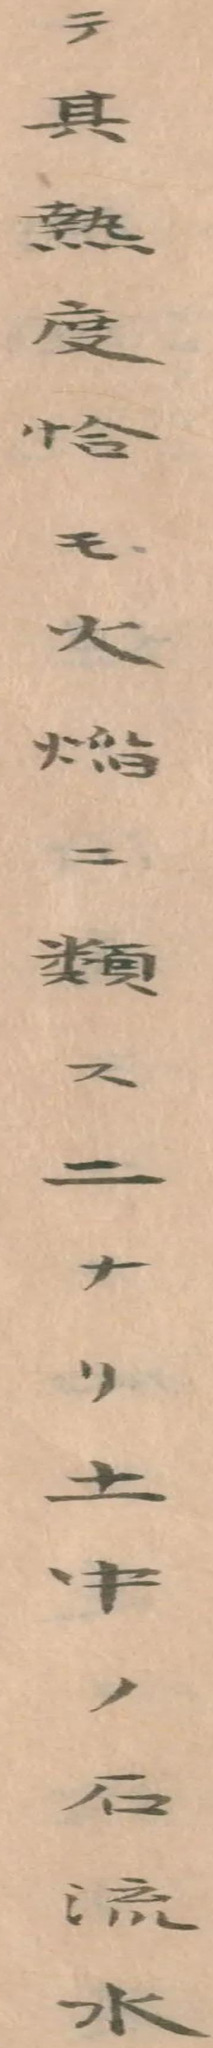テ其熱度恰モ火焔二類ス二ナリ土中ノ石流水
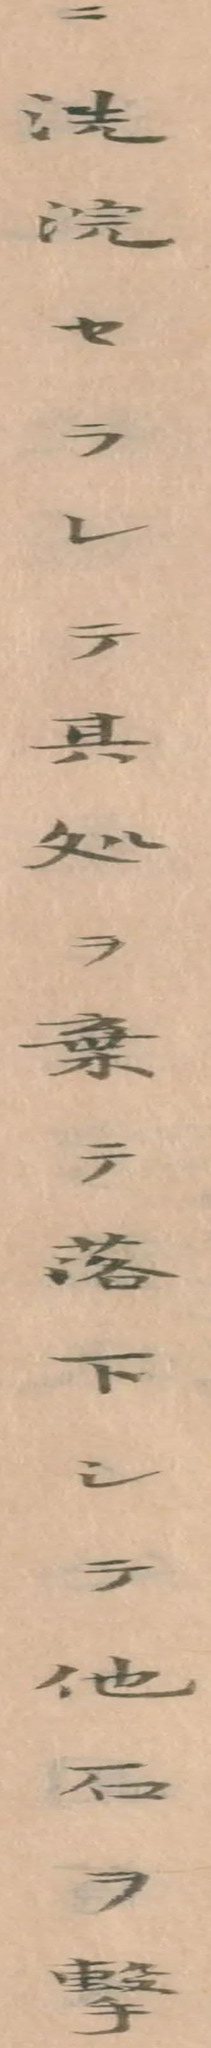二洗浣セラレテ其処ヲ棄テ落下シテ他石ヲ撃
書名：地災撮要. 巻1(噴火山・地震ノ部)
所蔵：国立国会図書館 National Diet Library, JAPAN
